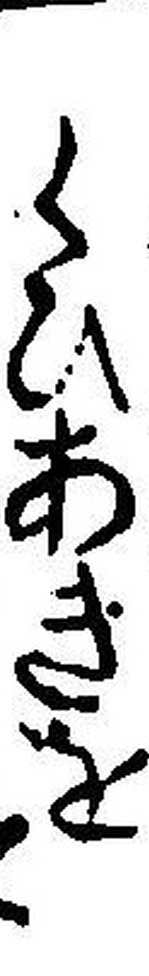くひあきを
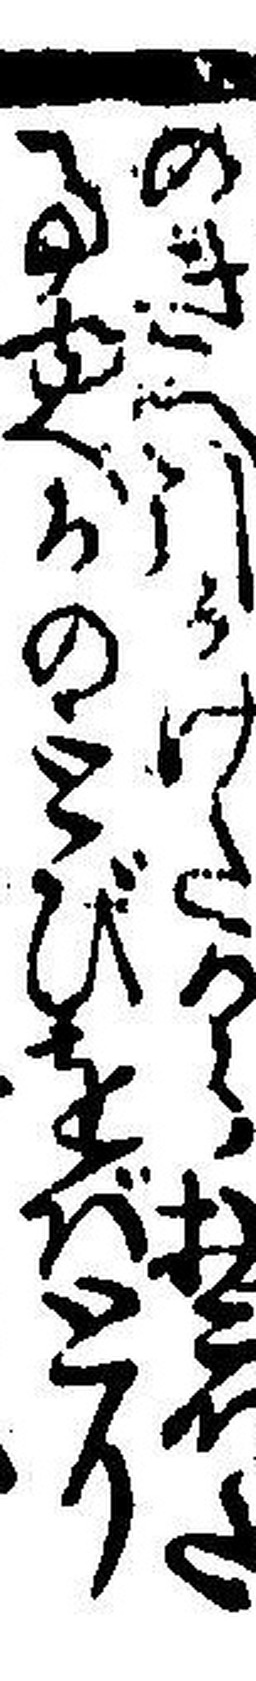事ゆへかのとびをばとり
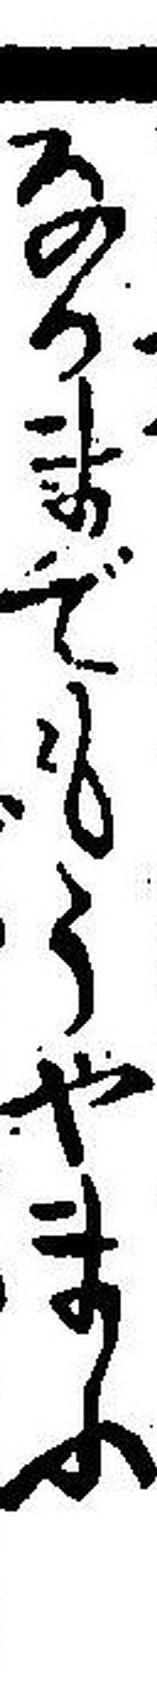なかまでもうやまふ
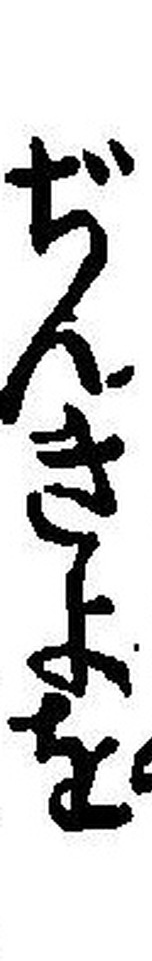ぢんきよを
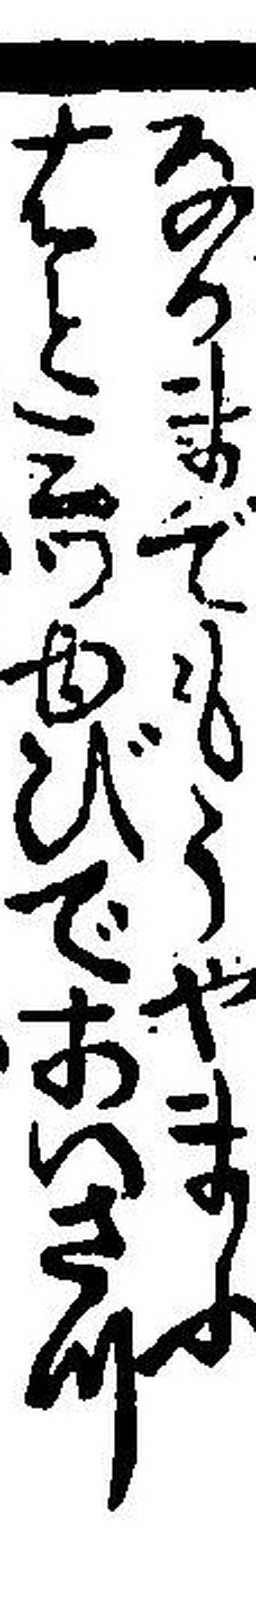はと三つゆびでおいさつ
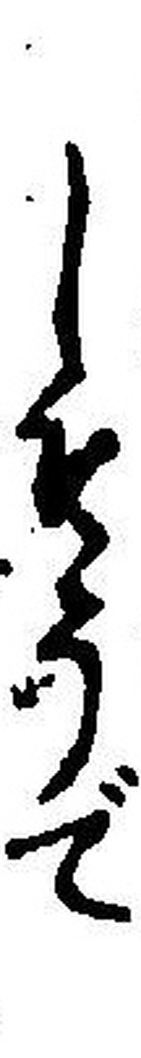しそうで
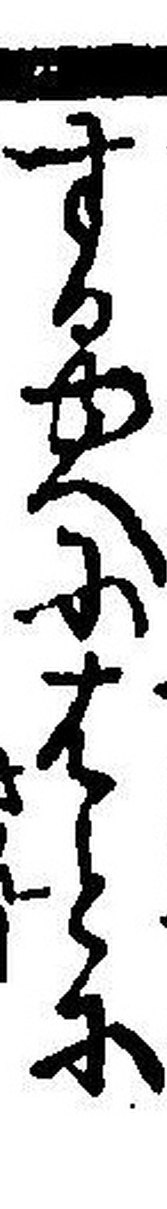するゆへにはとに
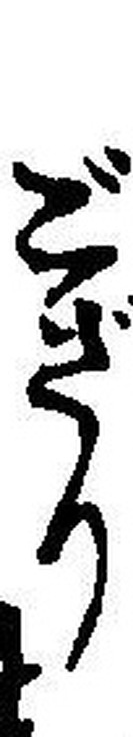ござり
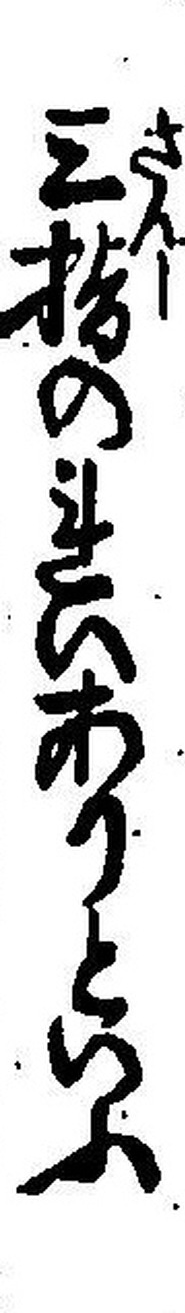三指のれいありといふ

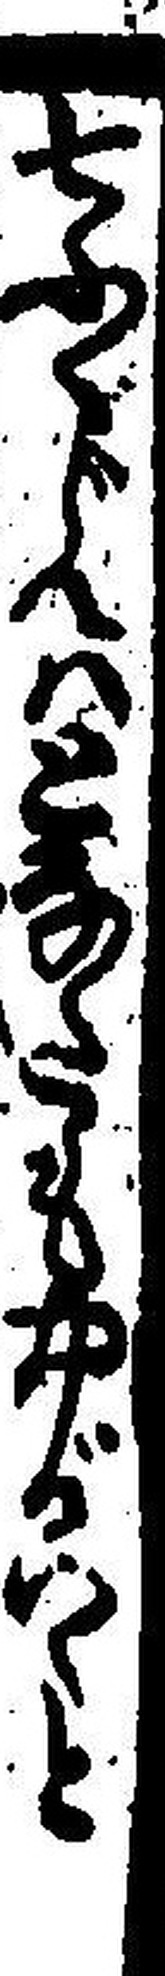しちふくじんはとなたも中がいゝと
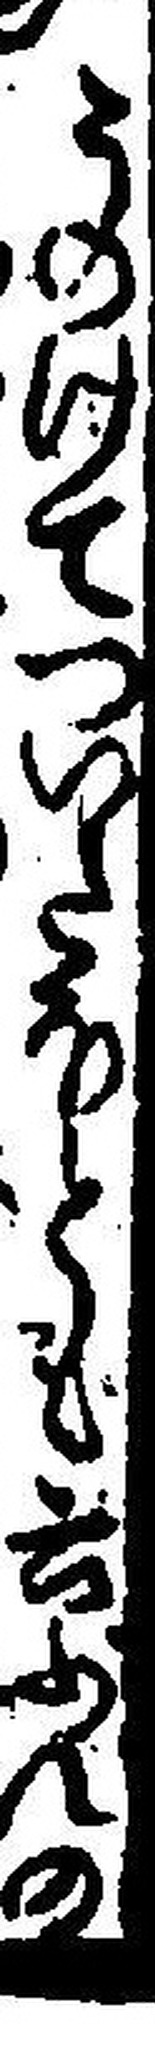うのけてついたほとも云ぶんの
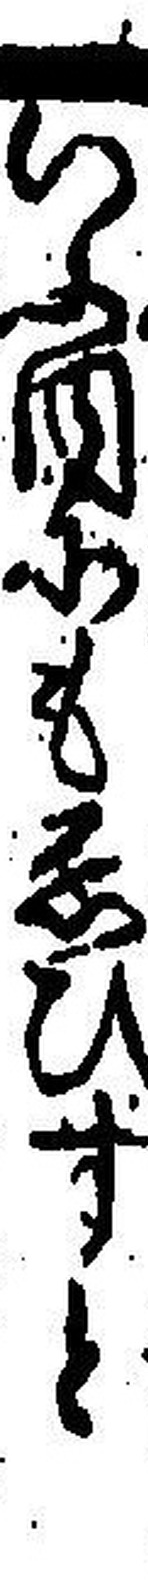いふ内にもゑひすと
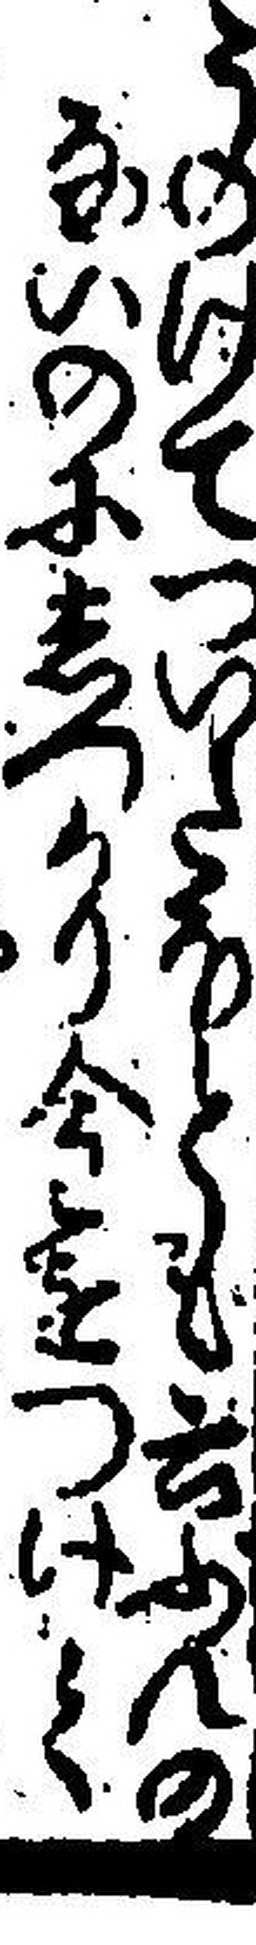ないのにしつかり金をつけて
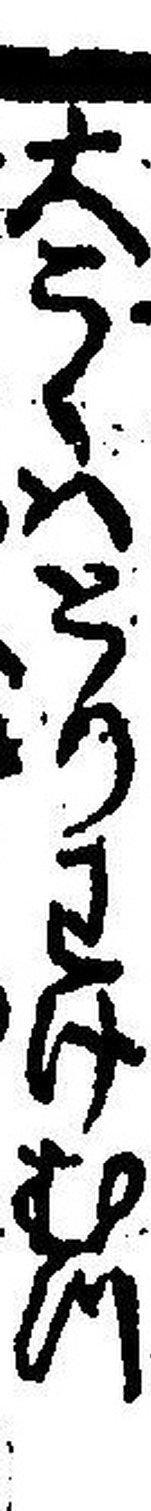大こくはとりわけむつ
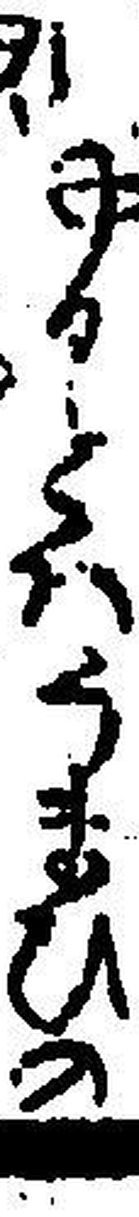やるとはかまひの
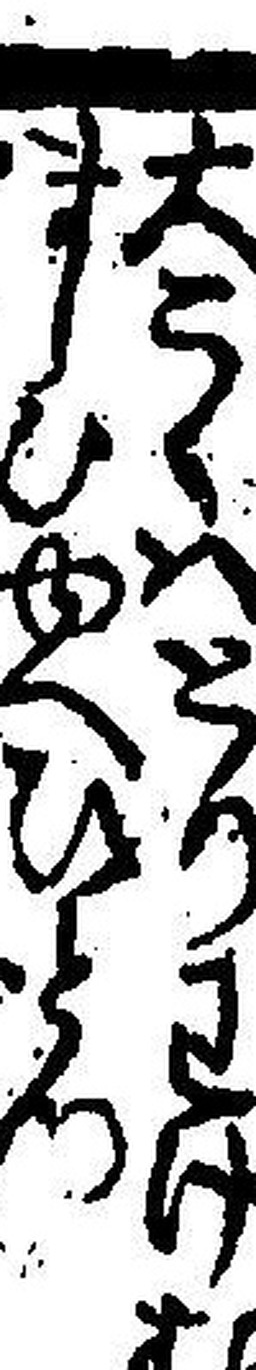ましひゆへひとつ
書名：徳若水縁起金性 / 樹下石上作
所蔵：東京大学総合図書館 General Library in the University of Tokyo, JAPAN
